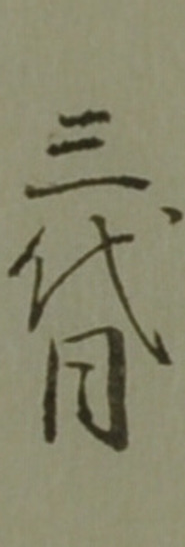三代目
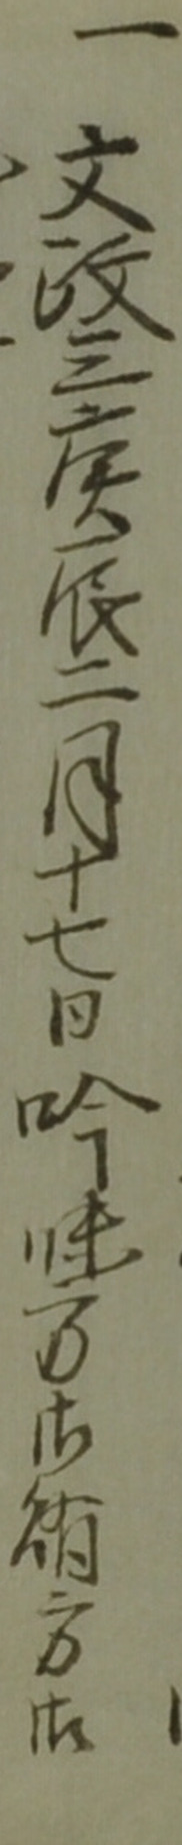一文政三庚辰二月十七日吟味方御賄方被
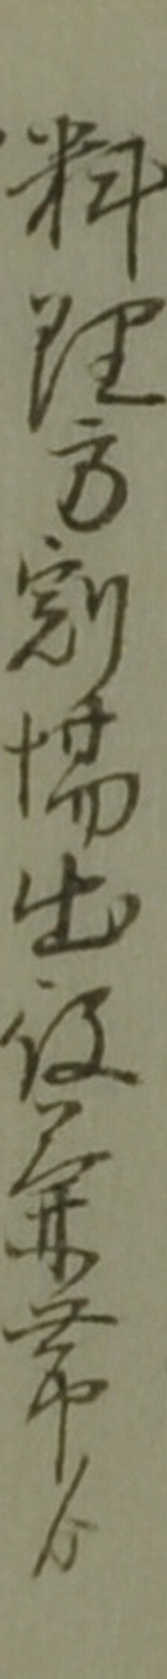料理方割場出役兼帯より
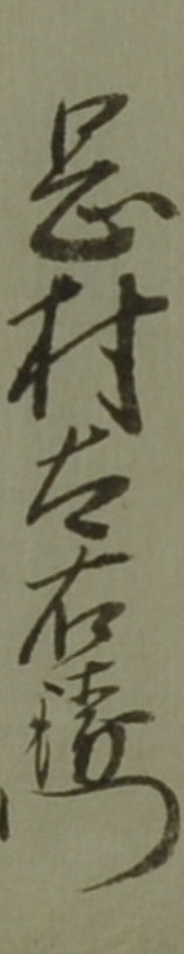岡村太右衛門
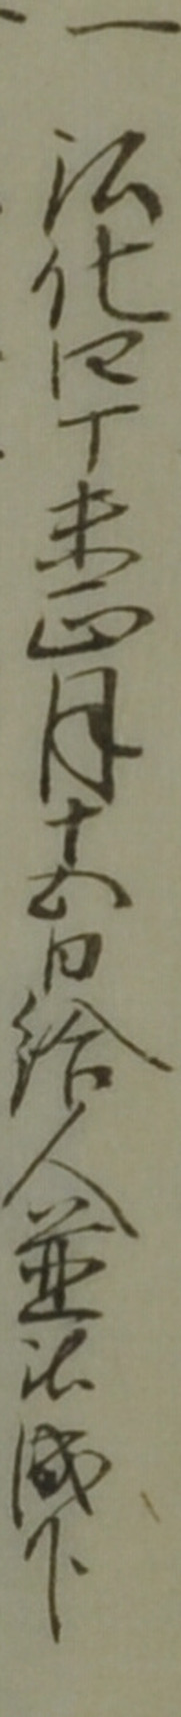一弘化四丁未正月十五日給人並被成下
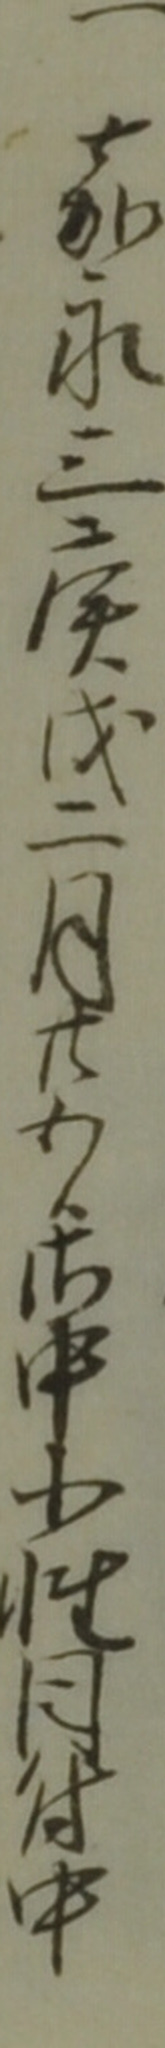一嘉永三庚戌二月廿五日御中小姓目付中
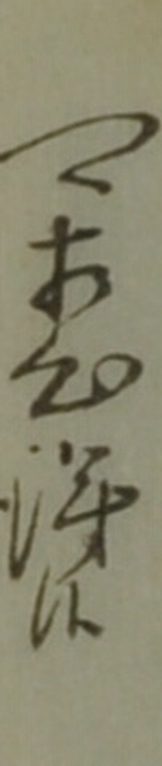可相心得候
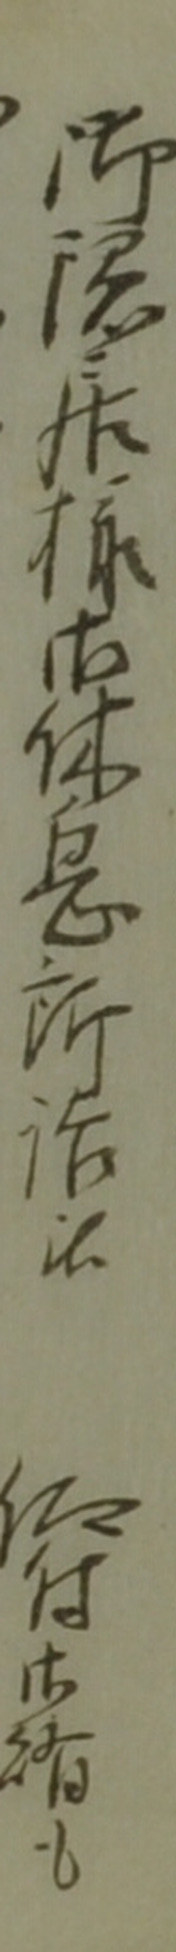御隠居様御休息所詰被仰付御賄も
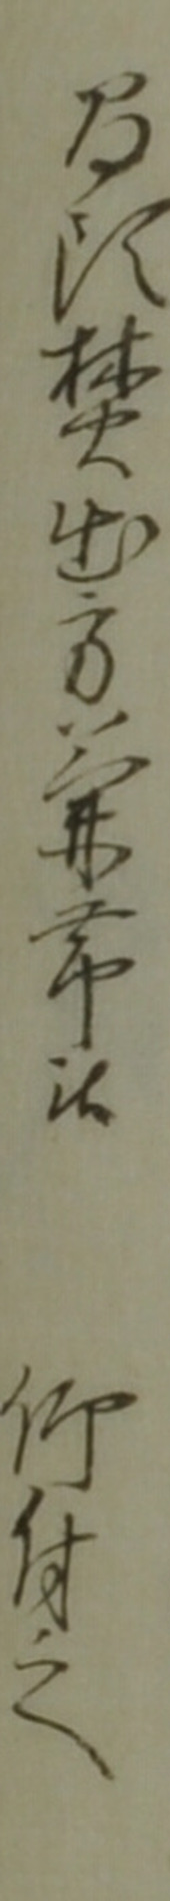間頭焚出方兼帯被仰付之
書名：諸御役代々録（八）
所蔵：伊那市立高遠町図書館・合同会社AMANE
